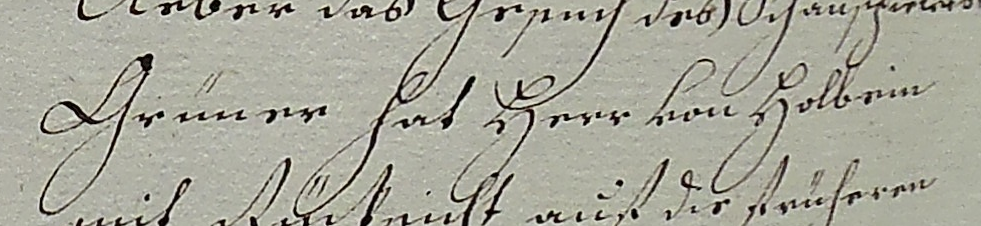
Grüner hat Herr von Holbein
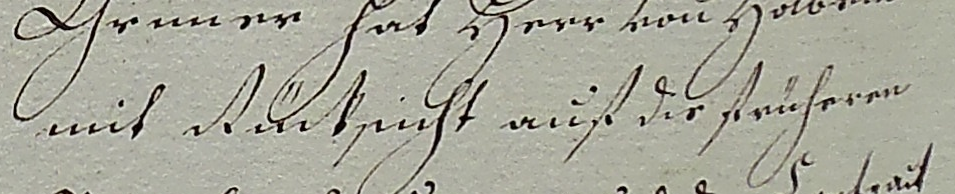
mit Rücksicht auf die früheren
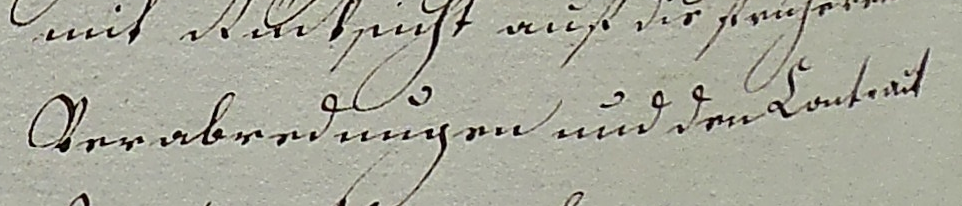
Verabredungen und den Contract
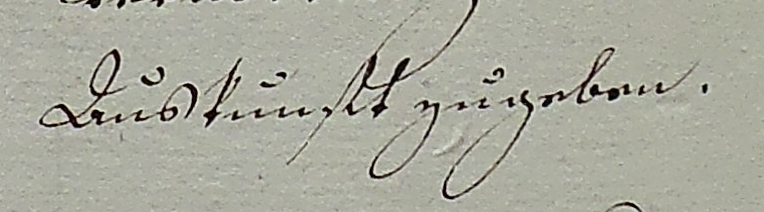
Auskunft zugeben.
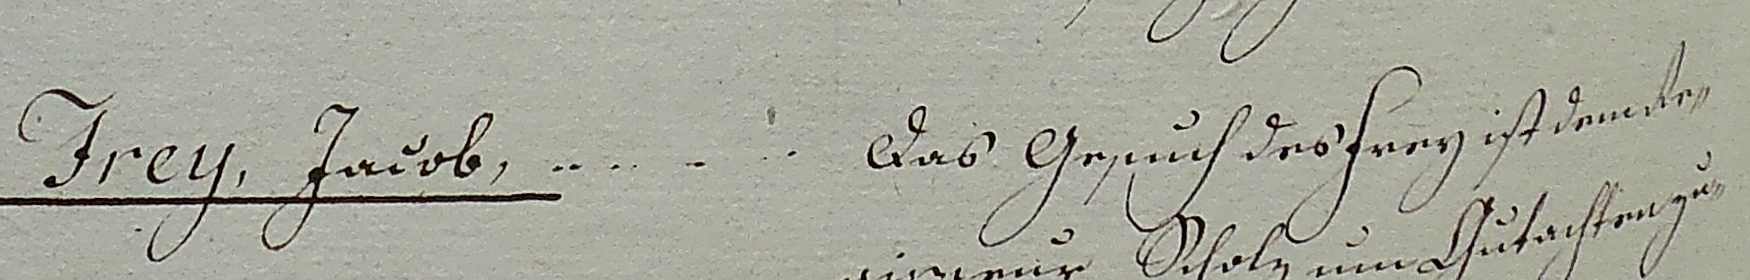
Frey, Jacob, .. .. .. .. Das Gesuch des Frey ist dem Re¬
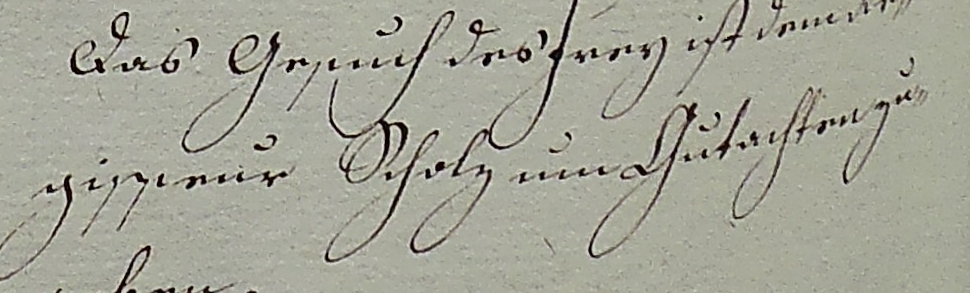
gisseur Scholz um Gutachten zu
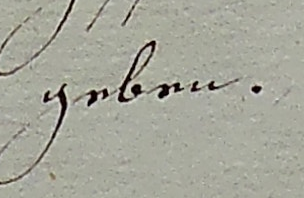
geben.
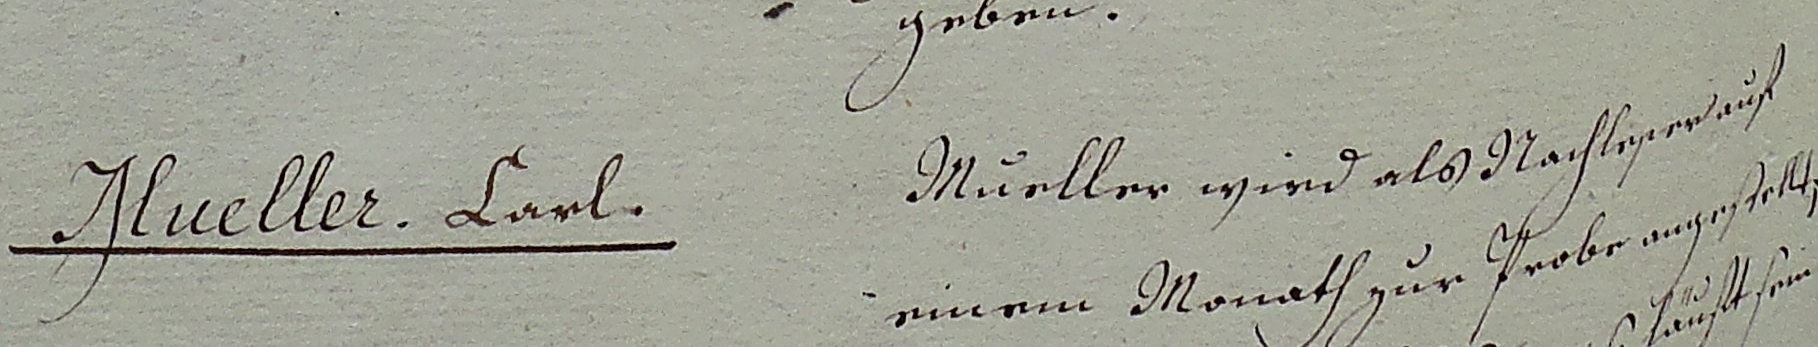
Mueller. Carl. Mueller wird als Nachleser auf
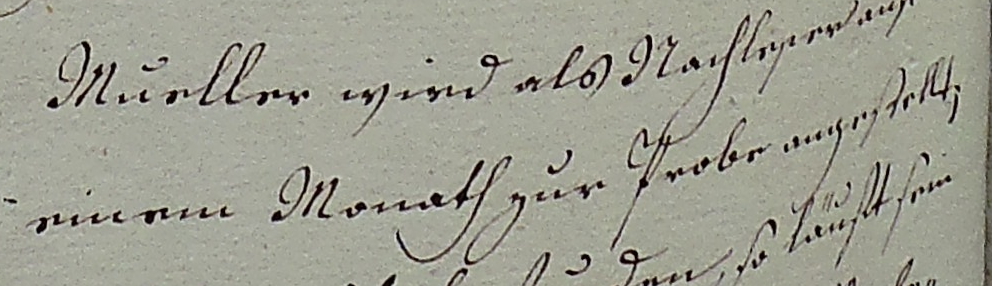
einem Monath zur Probe angestellt,
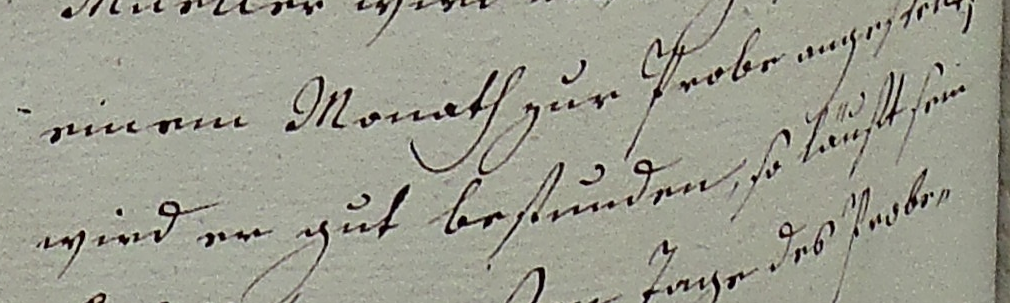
wird er gut befunden, so läuft sein
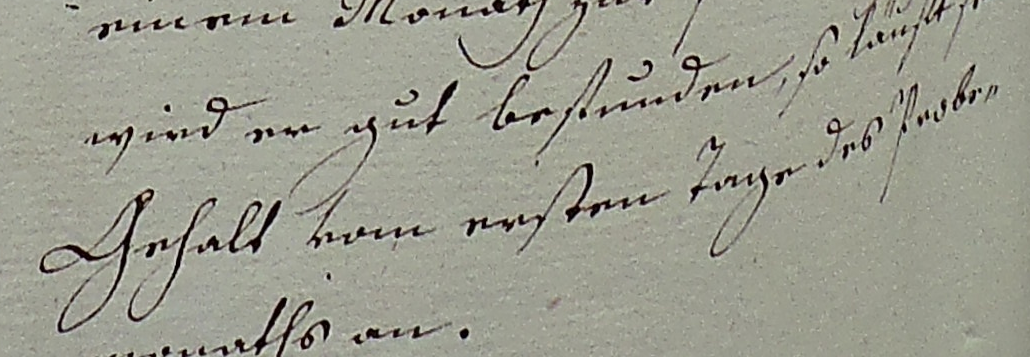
Gehalt vom ersten Tage des Probe¬
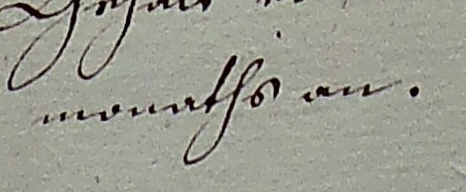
monaths an.
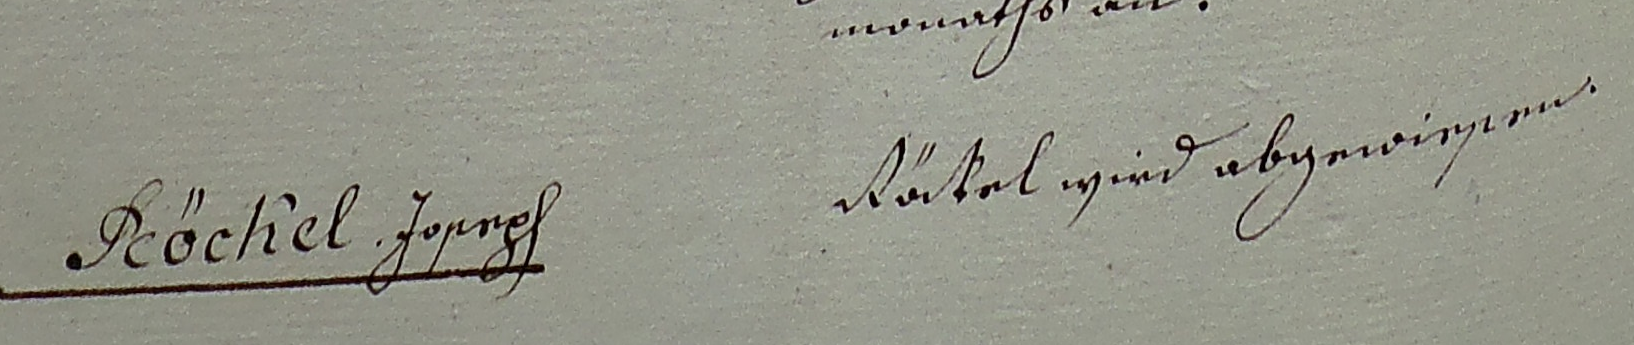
Röckel. Joseph Röckel wird abgewiesen.
